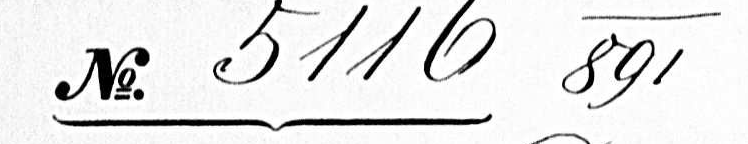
No. 5116 - 891
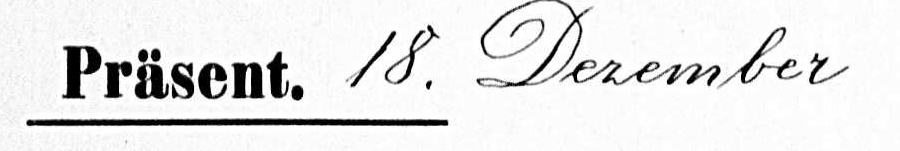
Präsent. 18. Dezember
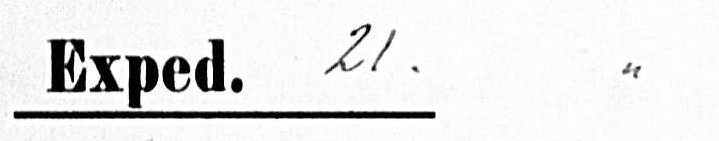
Exped. 21. „
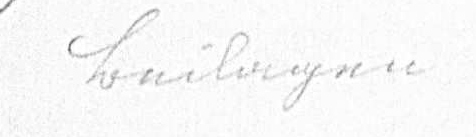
Beilagen
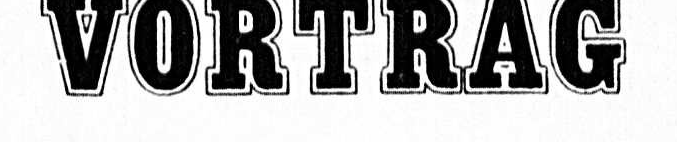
VORTRAG
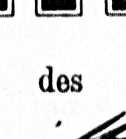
des
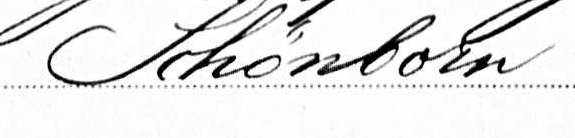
Schönborn
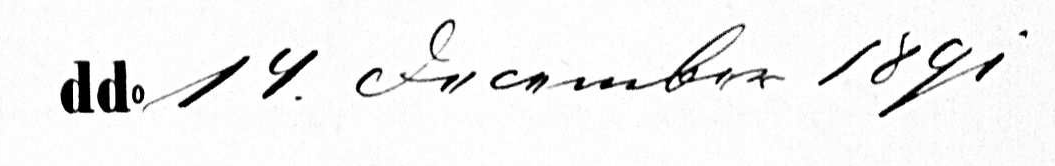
ddo 14. December 1891
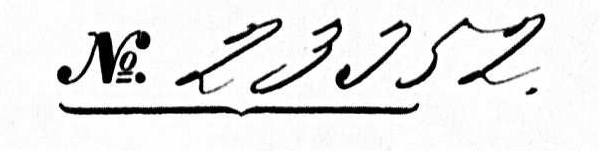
No. 23352
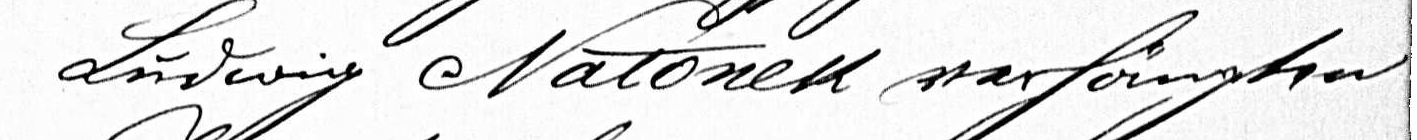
Ludwig Natonek verhängten
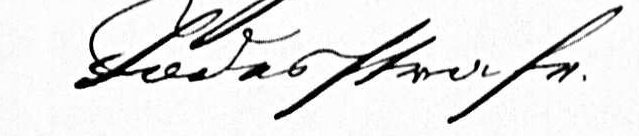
Todesstrafe.
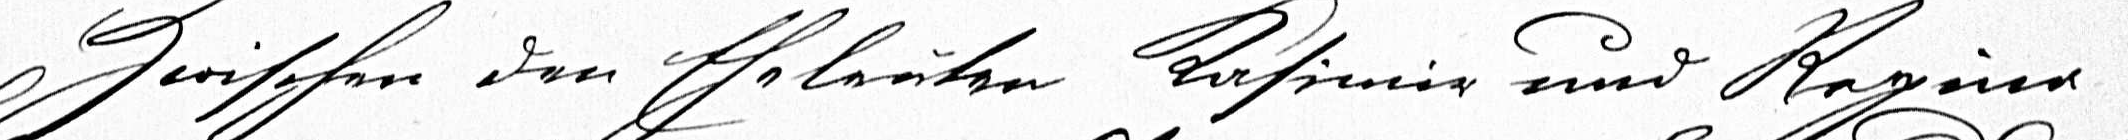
Zwischen den Eheleuten Kasimir und Regina
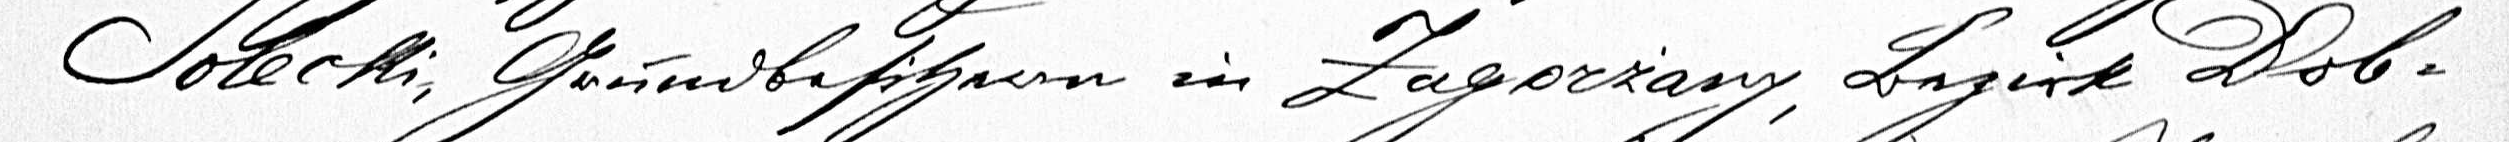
Solecki, Grundbesitzer in Zagorżany, Bezirk Dob¬
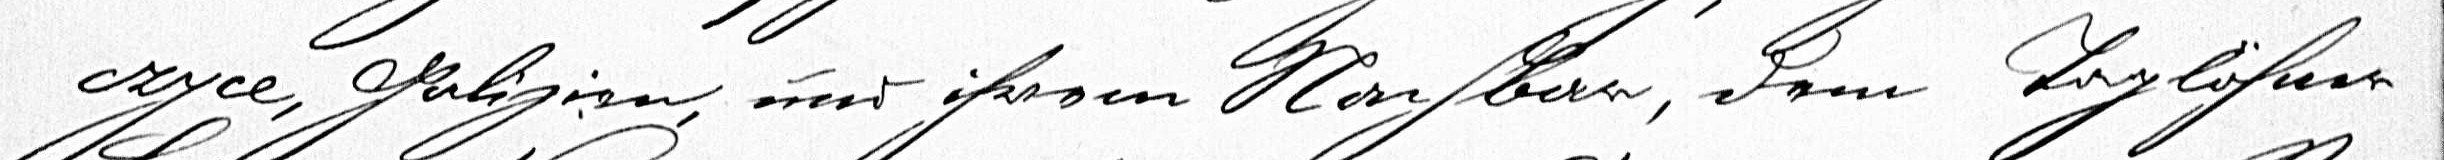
czyce, Galizien, und ihrem Nachbar, dem Taglöhner
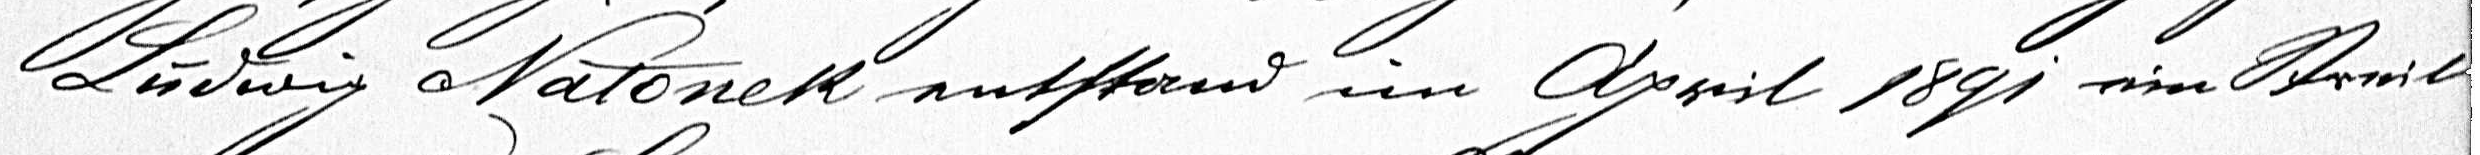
Ludwig Natonek entstand im April 1891 ein Streit
